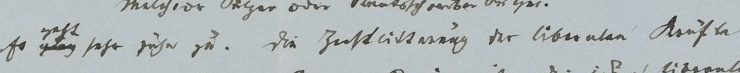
Es ginggeht sehr zähe zu. Die Zersplitterung der liberalen Kräfte
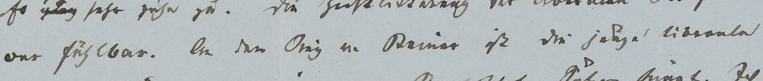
war fühlbar. An dem Sieg v. Steiner ist die junge liberale
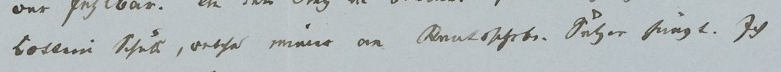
Cotterie Schuld, welche immer an Staatsschrbr. Sulzer hängt. Ich
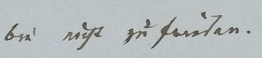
bin nicht zufrieden. –
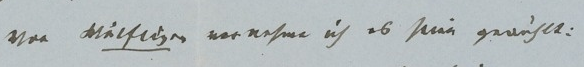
Von Wülflingen vernehme ich es seien gewählt:
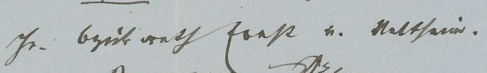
Hr. Bezirksrath Ernst v. Veltheim
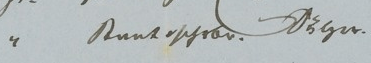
" Staatsschrbr. Sulzer.
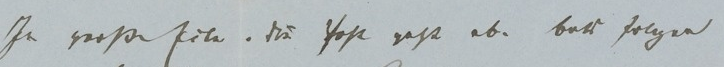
In großer Eile. Die Post geht ab. Bald folgen
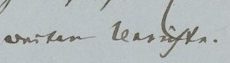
weiter Berichte.
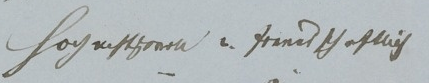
Hochachtgsvoll &. freundschaftlich
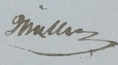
Müller
